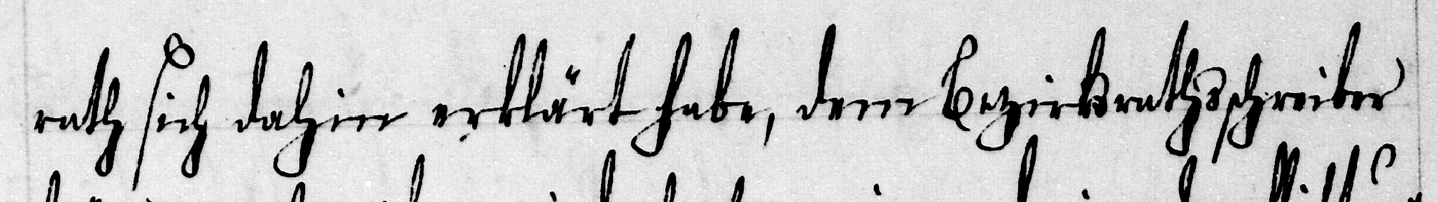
rath sich dahin erklärt habe, dem Bezirksrathsschreiber
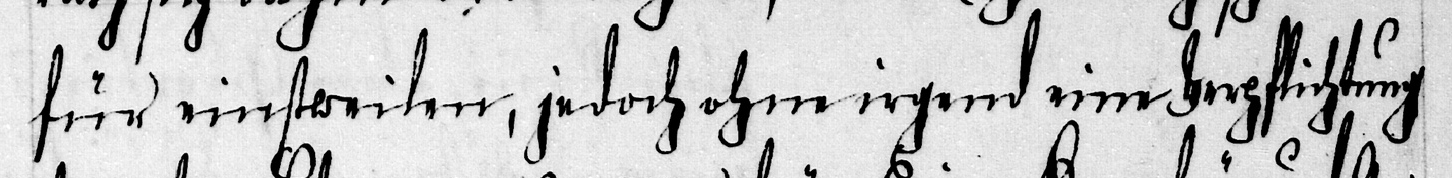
für einstweilen, jedoch ohne irgend eine Verpflichtung
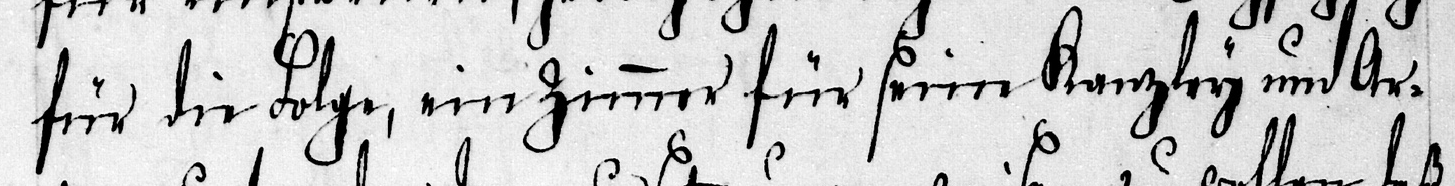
für die Folge, ein Zimmer für seine Kanzley und Ar¬
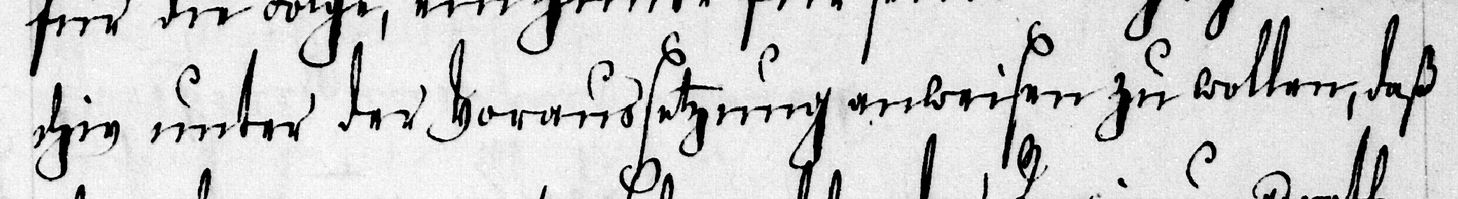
chiv unter der Voraussetzung anweisen zu wollen, daß
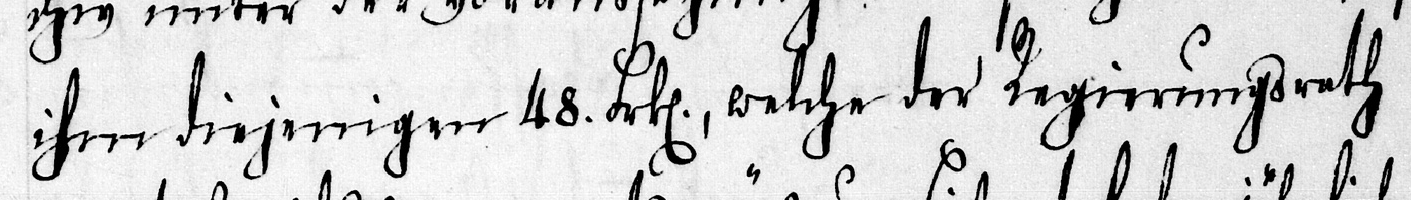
ihm diejenigen 48. Frk[en]., welche der Regierungsrath
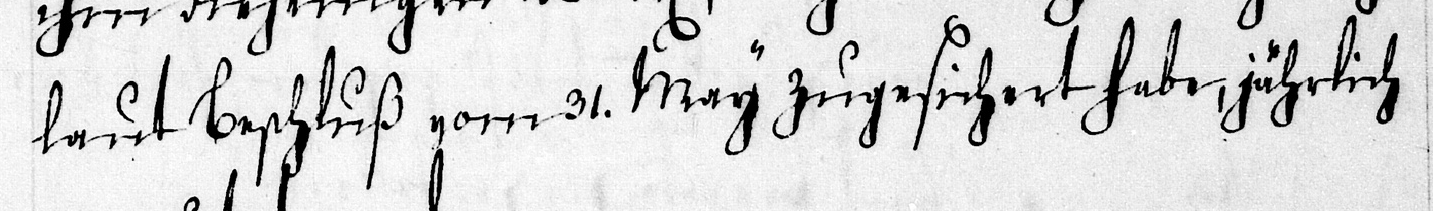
laut Beschluß vom 31. May zugesichert habe, jährlich
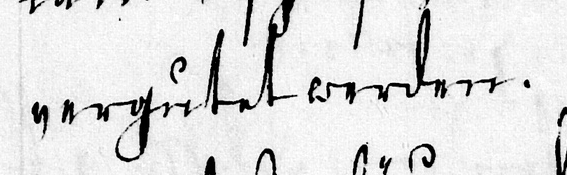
vergutet werden.
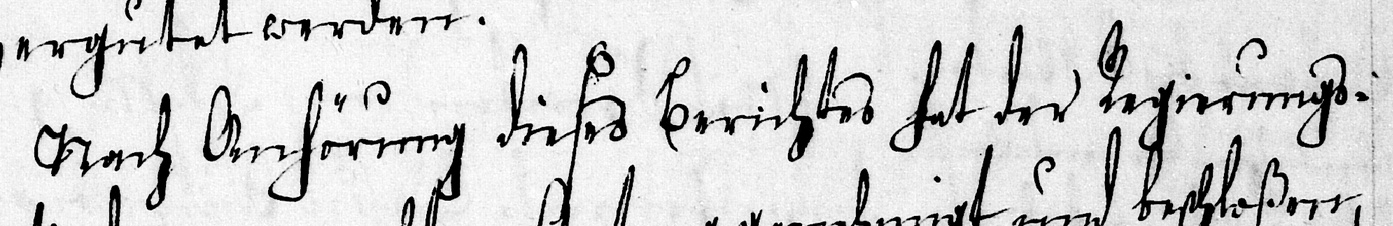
Nach Anhörung dieses Berichtes hat der Regierungs¬
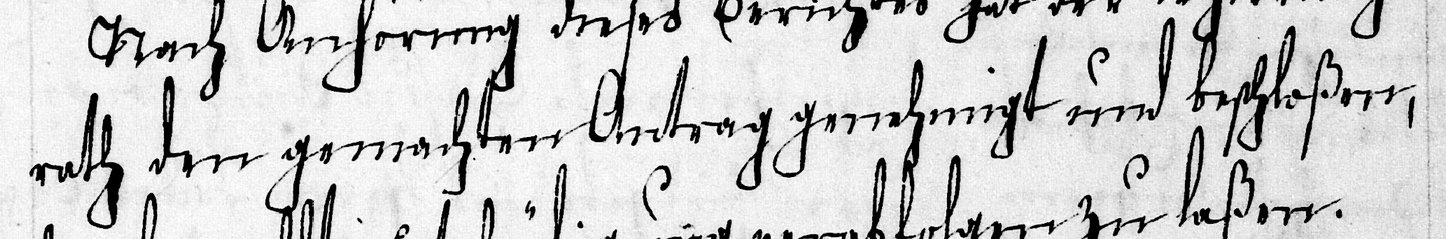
rath den gemachten Antrag genehmigt und beschloßen,
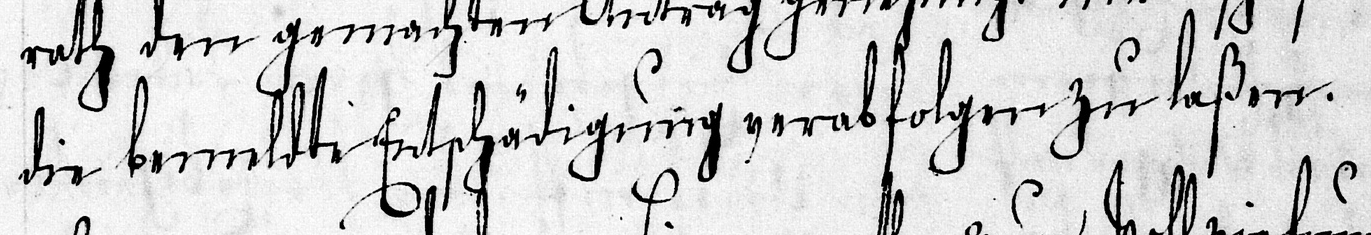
die bemeldte Entschädigung verabfolgen zu laßen.
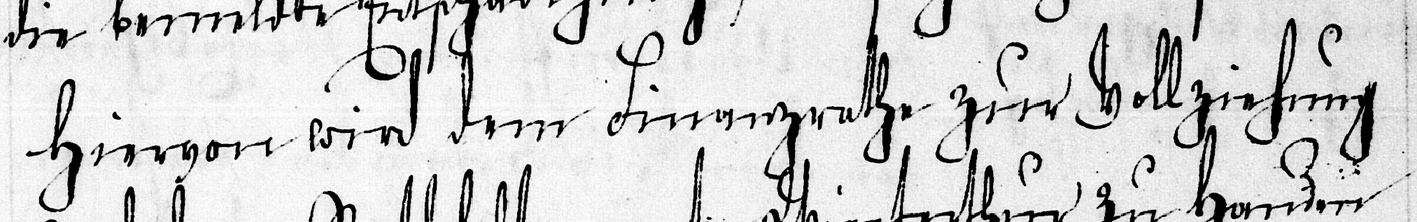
Hiervon wird dem Finanzrathe zur Vollziehung
